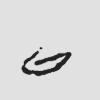㠯（以）
